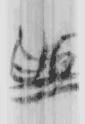爲
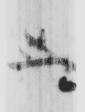之
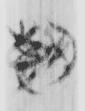{叀刃}
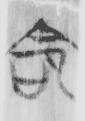命
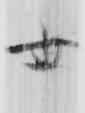才
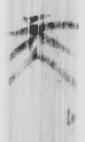天
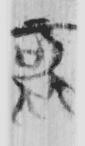{可䖵}
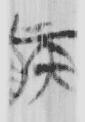疾
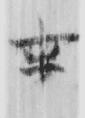才
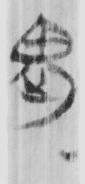畏
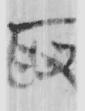取
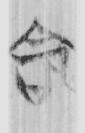命
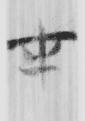才
